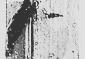一
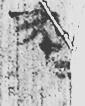九十=
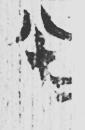八十=
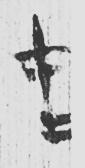七十=
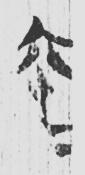六十=
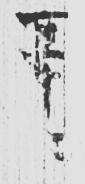五十=
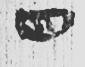四
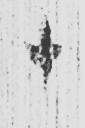十
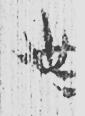卅=
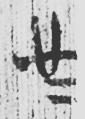廿=
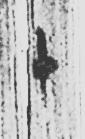十
